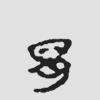日月
